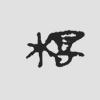梪
